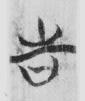告
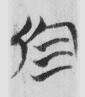於
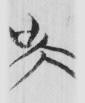吳
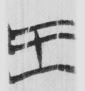王
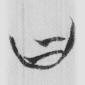曰
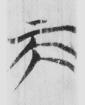天
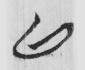㠯（以）
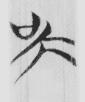吳
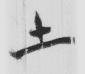土
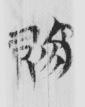賜
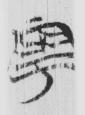𩁹
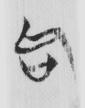句
